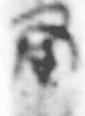君
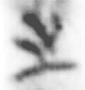之
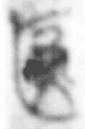○（圓）
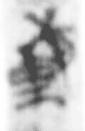軒
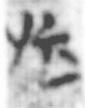○（左）
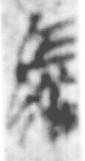○（服）
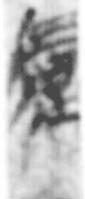騜
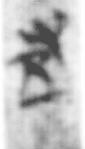○（右）
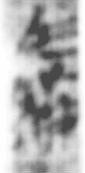○（服）
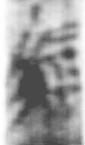○（牡）
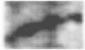一
